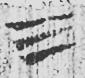三
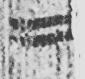二
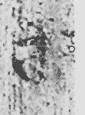百
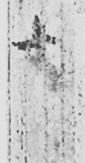七十=
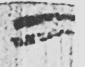二
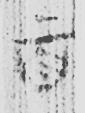百
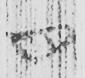四
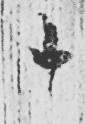十
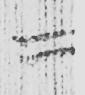二
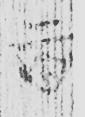百
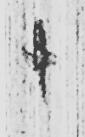十
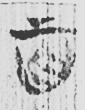百
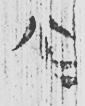八十=
